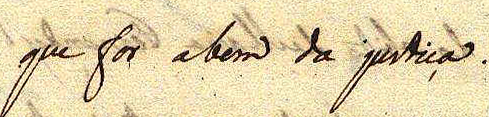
que for a bem da justiça.
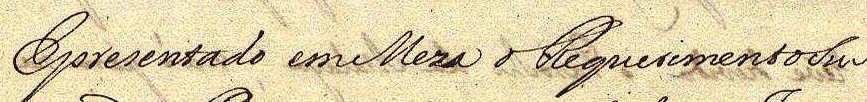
E presentado em Meza o Requerimento Su
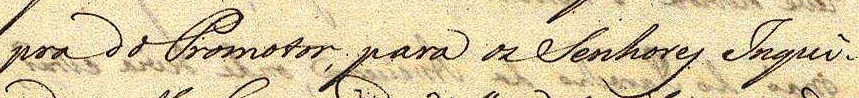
pra do Promotor, para os Senhores Inqui
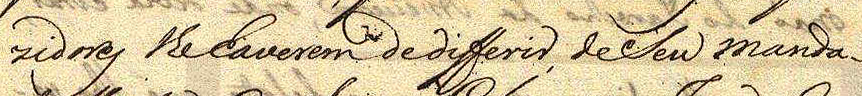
zidores lhe haverem de differir, de Seu manda
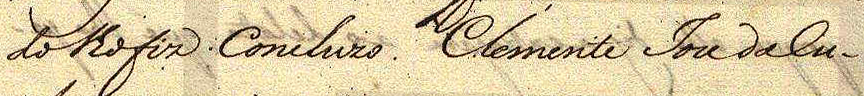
do lho fiz Concluzo. Clemente Ioze da Cu
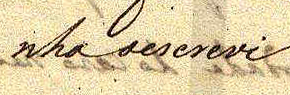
nha o escrevi
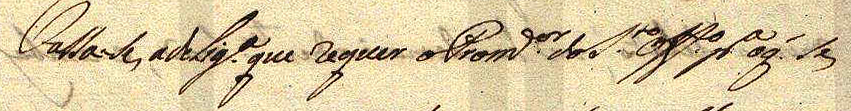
Passa-se, a delig.a que requer o Prom.or do S.to Off.o p.a o q̄ se
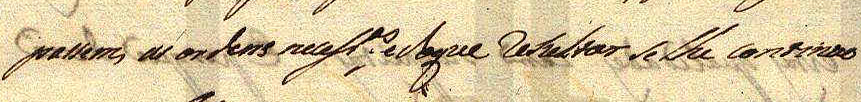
passem as ordens necess.as; e do que Resultar se lhe continue
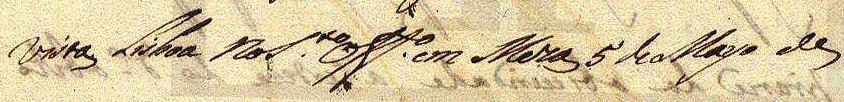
vista Lisboa no S.to Off.o em Meza 5 de Mayo de
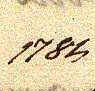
1784
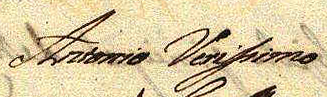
Antonio Verissimo
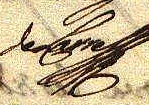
de Carre
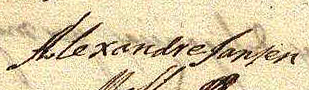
Alexandre Jansen
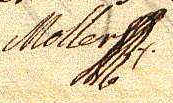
Moller
